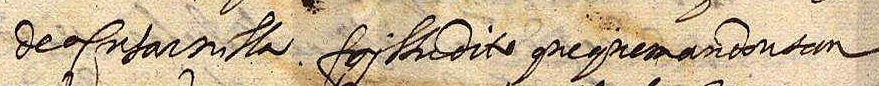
de aCusar nella. foylhe dito que quem andou tan
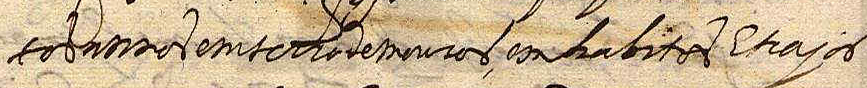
tos annos em terra de mouros, em habito E trajos
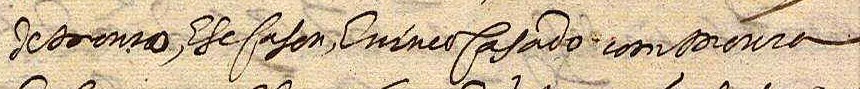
de mouro, E se Casou, E uiueo Casado com moura
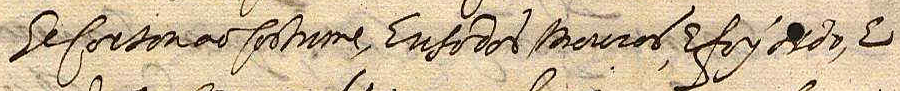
se Cortou ao Costume, E uso dos mouros, E foy tido, E
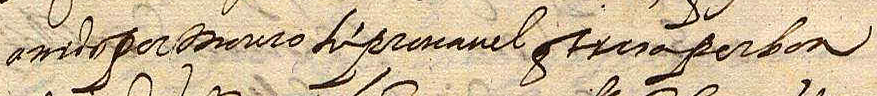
auido por mouro he prouauel q̄ tiria por boa
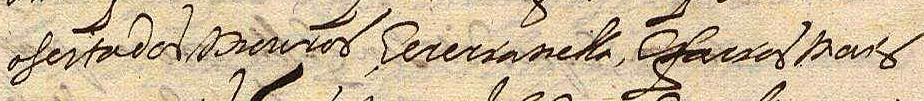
a seita dos mouros, E creria nella, E farias mais
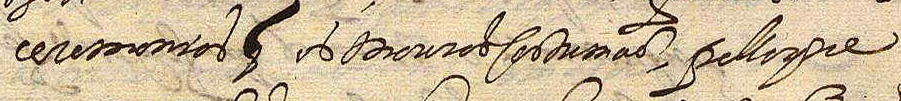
ceremonias q̄ os mouros Costumaõ, pello que
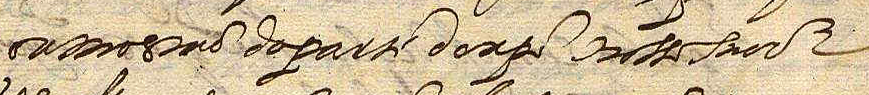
o amoestaõ da parte de xpō nosso snor̄
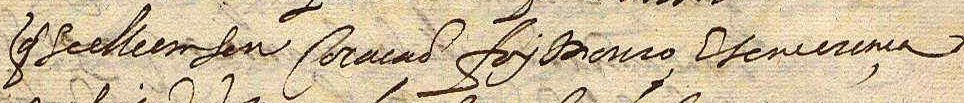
q̄ se elle em seu Coraçaõ foy mouro, E teue crença
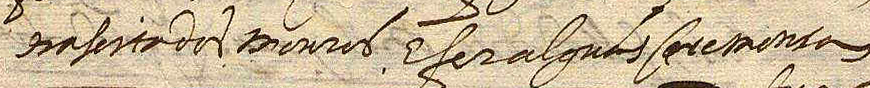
na seita dos mouros, E fez alguas̄ Ceremonias
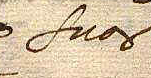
suas
